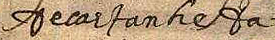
De castanheDa
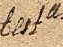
testas
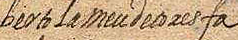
bertolameu de tores fa
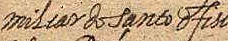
miliar do santo ofisio
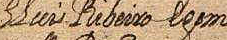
E Luis Ribeiro e gom
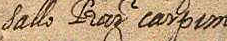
sallo Roiz̄ carpim
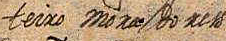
teiro moradoress
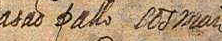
a saõ pallo e os mais
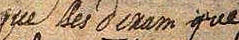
que lles diram que
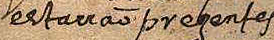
estauaõ prezentes
